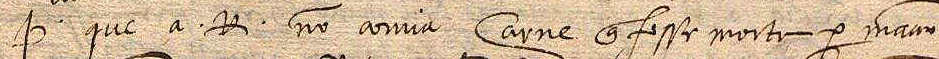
Pra. que a .R. n̄o comia Carne q̄ fosse morta ꝑ maão
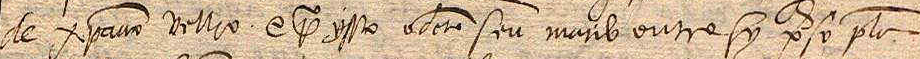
de xpaão velho . e p̄o ysso o d̄cto seu marido outrosy p̄so p̄la
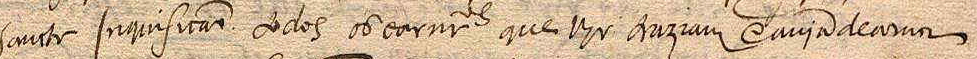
Sancta Jnquisicão todos os carnros que lhe traziam e aujā de comer
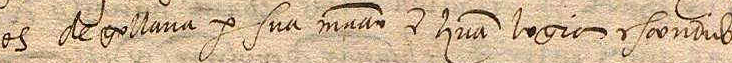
os degollaua ꝑ sua maão ē hūa logia escondido
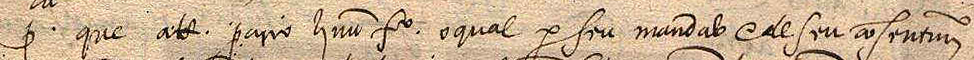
Pra. que a .R. pario hūu fo. o qual ꝑ seu mandado e de seu c̄osentimto
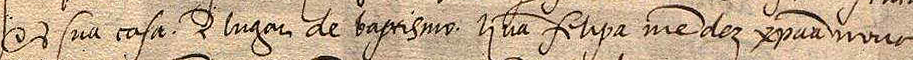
e ē sua casa. ē lugar de baptismo. hūa felipa m̄edez xpāa noua
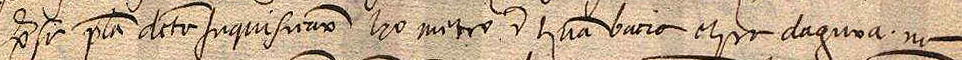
p̄sa p̄la dc̄ta Jnquisicão ho meteo ē hūa bacia chea daguoa. na
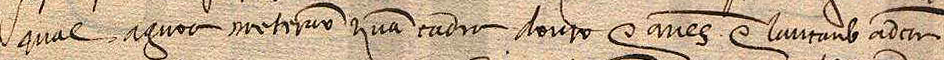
qual aguoa meterão hūa cadea douro e ānes e lancando a d̄cta
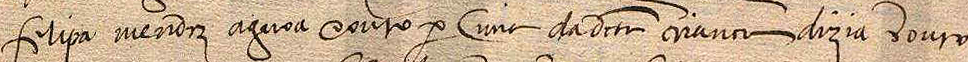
felipa mendez aguoa e ouro ꝑ Cima da dc̄ta crianca dizia ē ouro
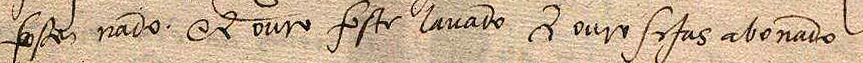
foste nado. e ē ouro foste lauado ē ouro seJas abonado
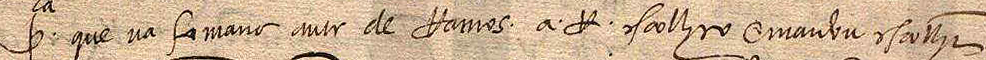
Pra. que na somana ante de Ramos. a .R. escolheo e mandou escol̄hr
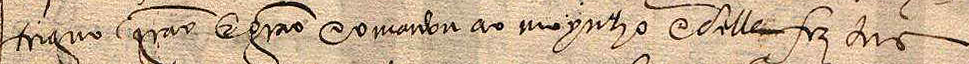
triguo / grão e grão e o mandou ao moynho e delle fez tres
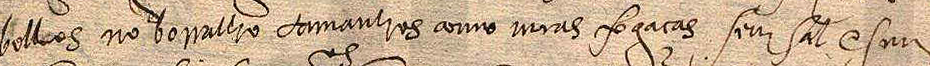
bollos no borralho tamanhos como meas fogaças sem sal e sem
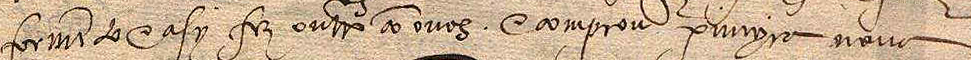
formēto e asy fez outros c̄o ouos. e comprou pineyra noua
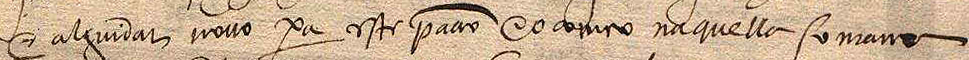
e alguidar nouo ꝑa este paão e o comeo naquella somana
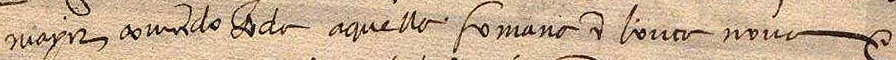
mayor comēdo toda aquella somana ē louca noua e
